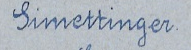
Simettinger.
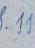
S. 11.
